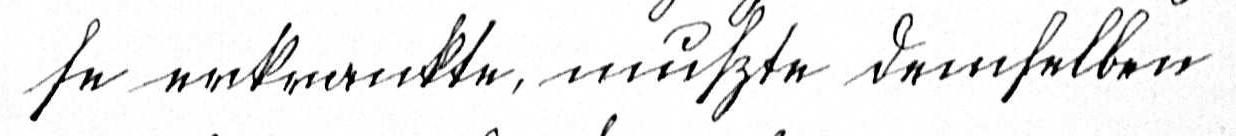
se erkrankte, mußte demselben
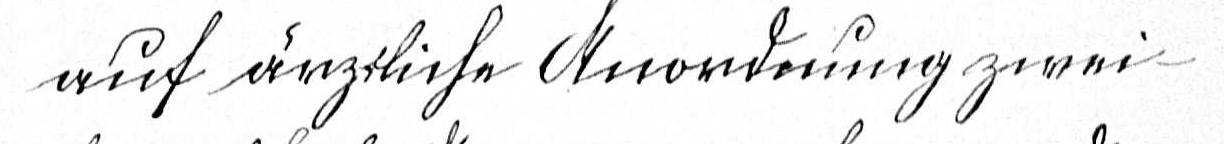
auf ärztliche Anordnung zwei¬
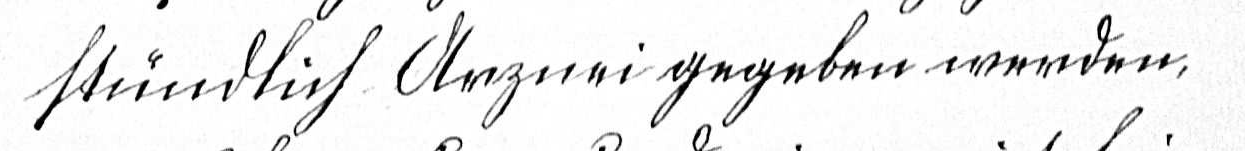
stündlich Arznei gegeben werden,
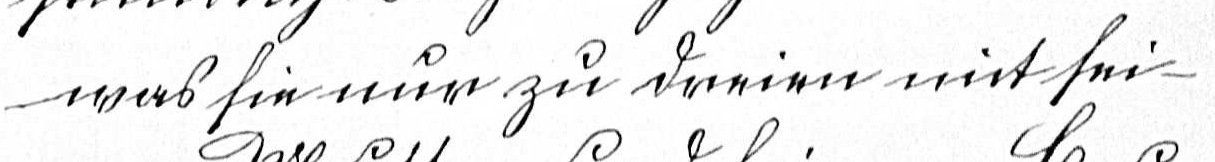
was sie nur zu dreien mit sei¬
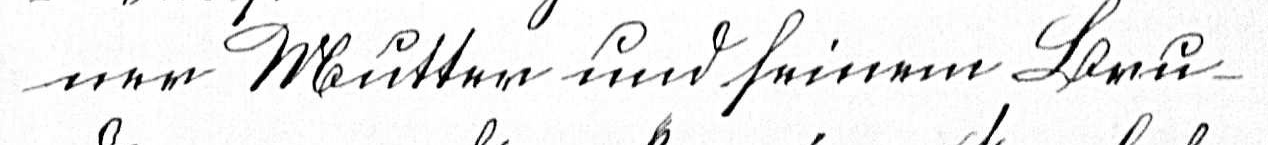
ner Mutter und seinem Bru¬
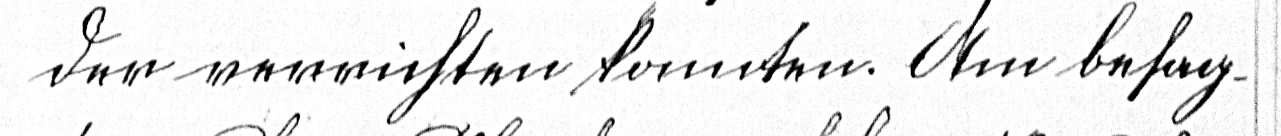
der verrichten konnten. Am besag¬
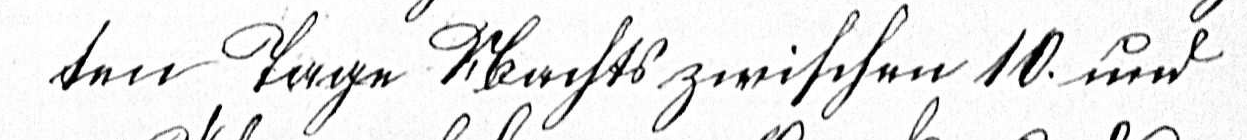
ten Tage Nachts zwischen 10 und
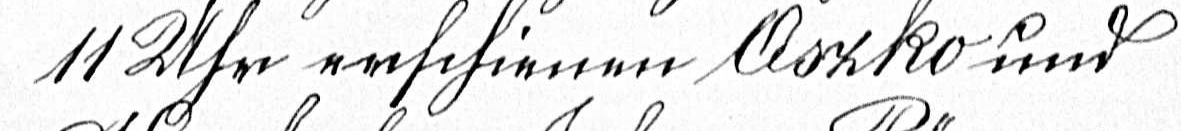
11 Uhr erschienen Oszko und
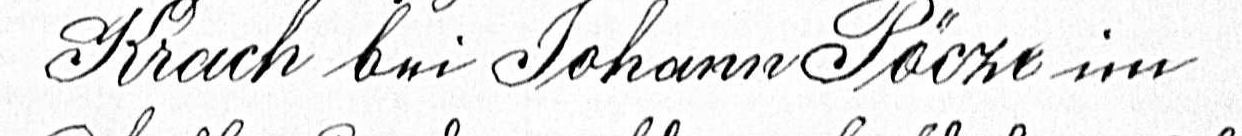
Krach bei Johann Pöcze im
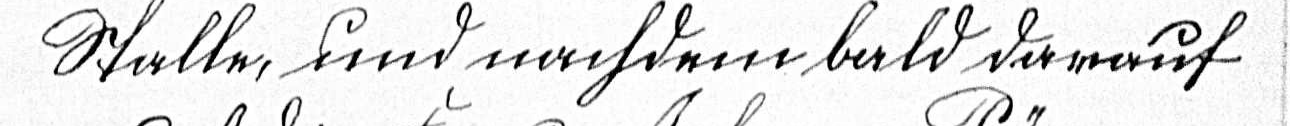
Stalle, und nachdem bald darauf
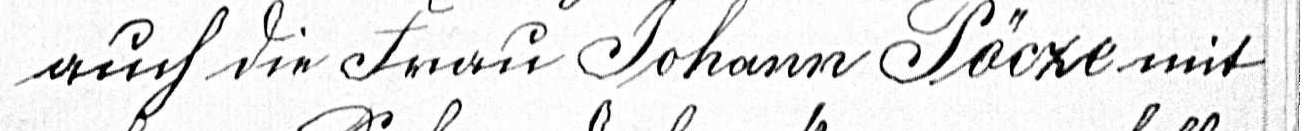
auch die Frau Johann Pöcze mit
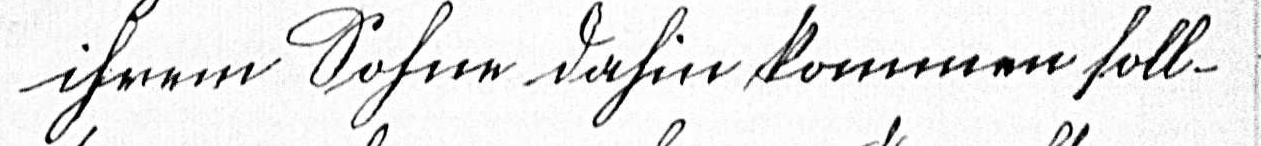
ihrem Sohne dahin kommen soll¬
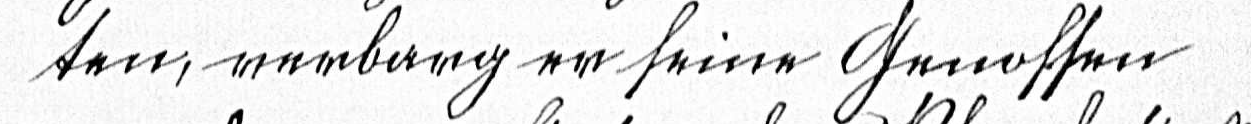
ten, verbarg er seine Genossen
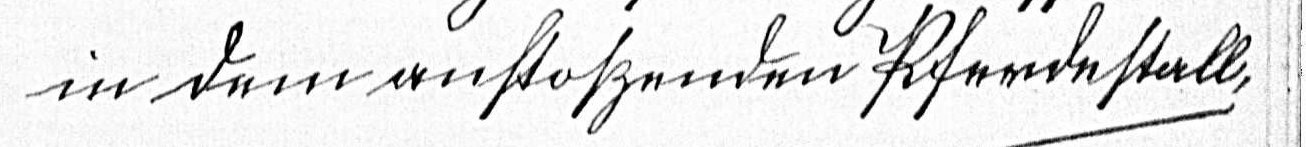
in dem anstoßenden Pferdestall,
